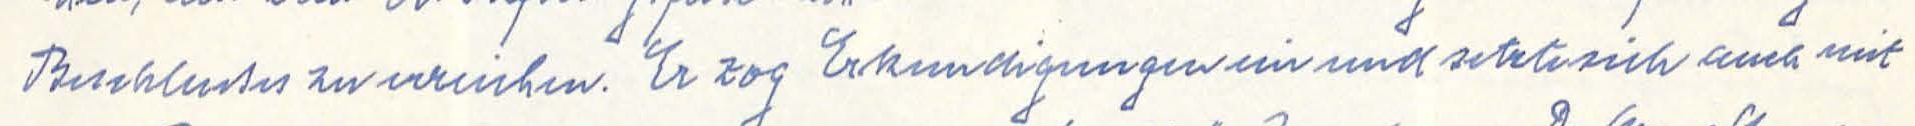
Beschlusses zu erreichen. Er zog Erkundigungen ein und setzte sich auch mit
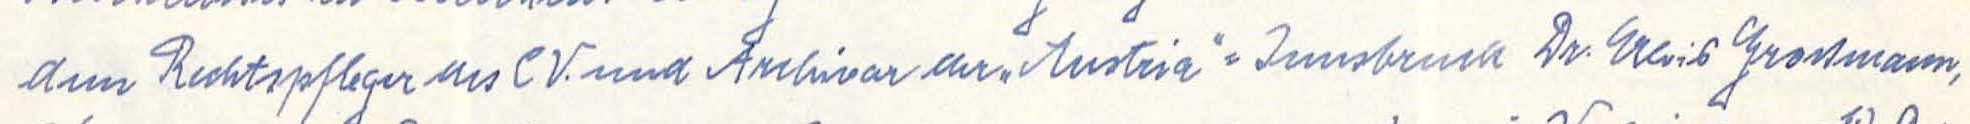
dem Rechtspfleger des C.V. und Archivar der "Austria"-Innsbruck Dr. Alois Grossmann,
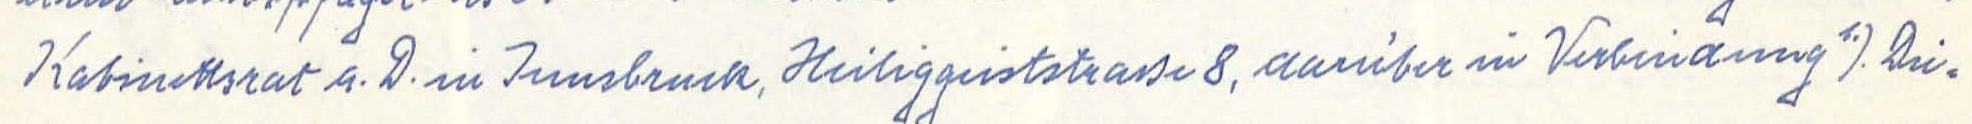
Kabinettsrat a. D. in Innsbruck, Heiliggeiststraße 8, darüber in Verbindung 1.) Die-
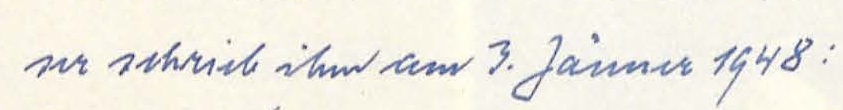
ser schrieb ihm am 3. Jänner 1948:
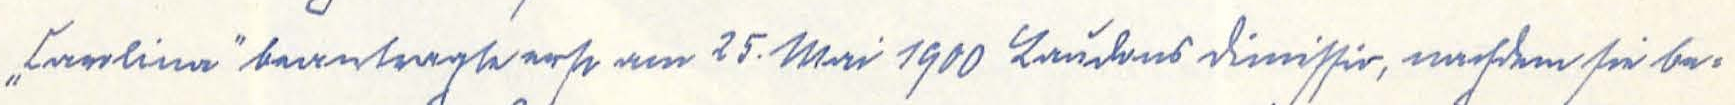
"Carolina" beantragte erst am 25. Mai 1900 Laudons Dimissio, nachdem sie be-
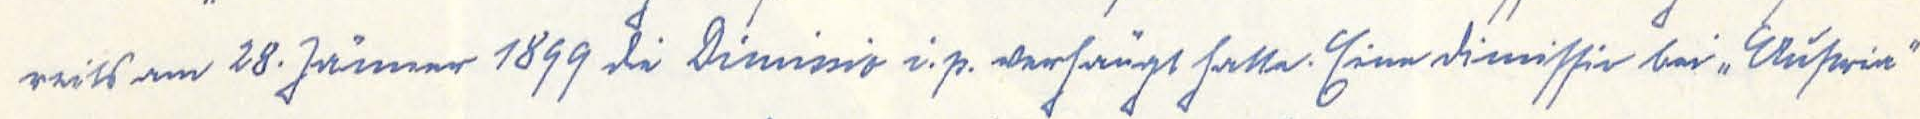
reits am 28. Jänner 1899 die Dimissio i. p. verhängt hatte. Eine Dimissio bei "Austria"
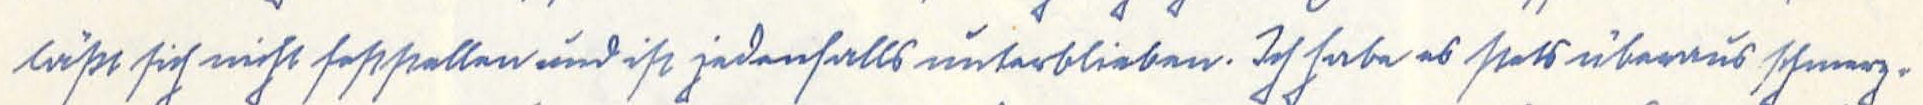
läßt sich nicht feststellen und ist jedenfalls unterblieben. Ich habe es stets überaus schmerz-
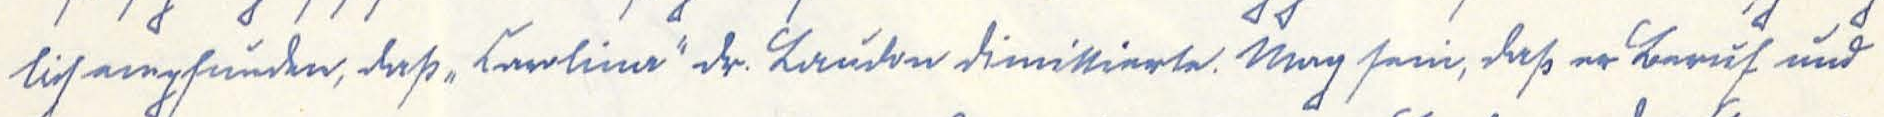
lich empfunden, daß "Carolina" Dr. Laudon dimittierte. Mag sein, daß er Beruf und
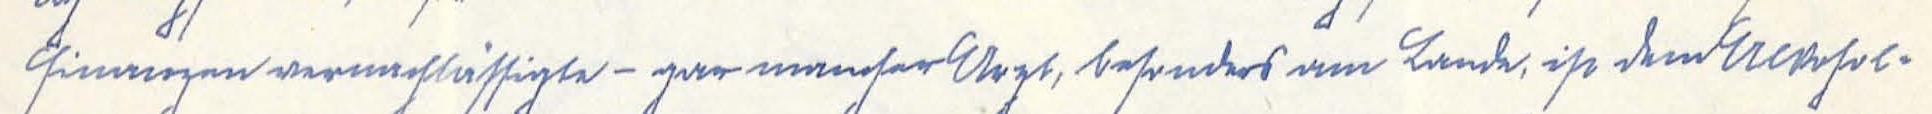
Finanzen vernachlässigte - gar mancher Arzt, besonders am Lande, ist dem Alkohol-
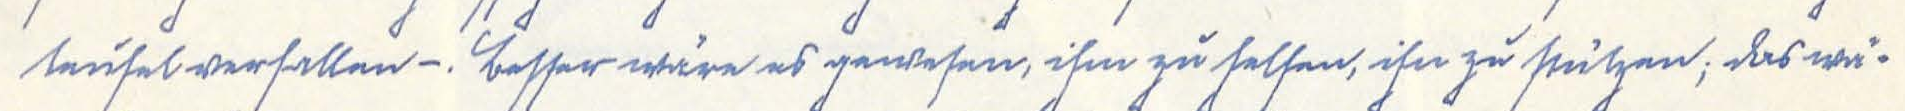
teufel verfallen-. Besser wäre es gewesen, ihm zu helfen, ihn zu stützen, das wä-
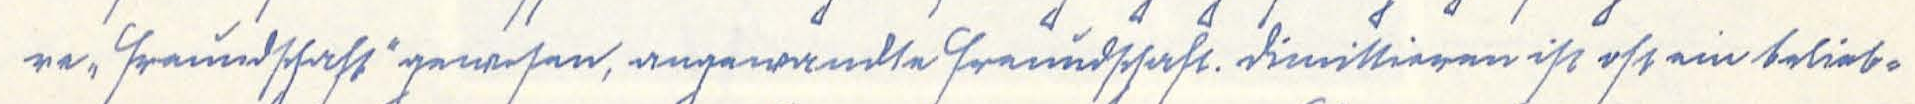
re "Freundschaft" gewesen, angewandte Freundschaft. Dimission ist oft ein belieb-
